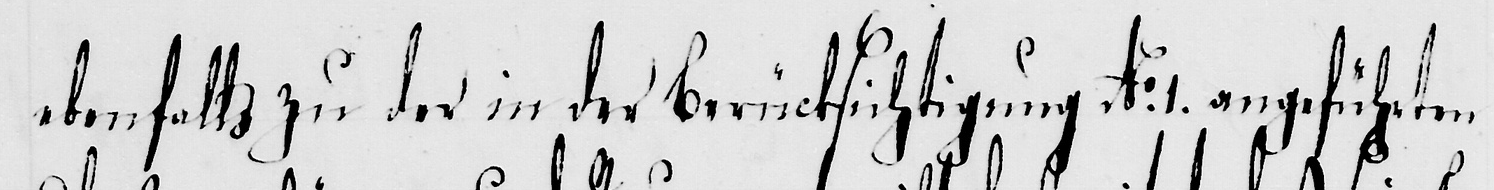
ebenfalls zu der in der Berücksichtigung No. 1. angeführ¬
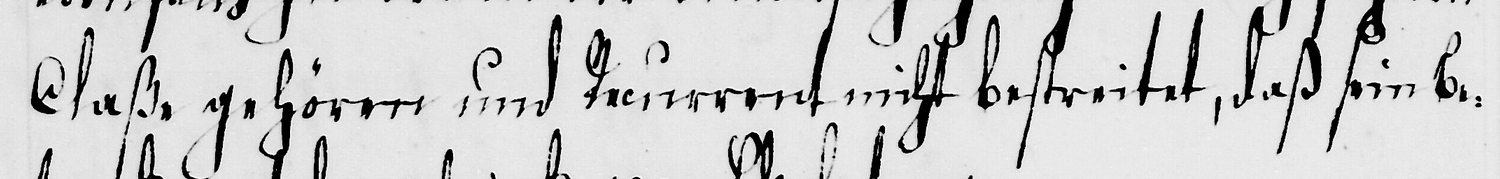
Claße gehören und Recurrent nicht bestreitet, daß sein Be¬
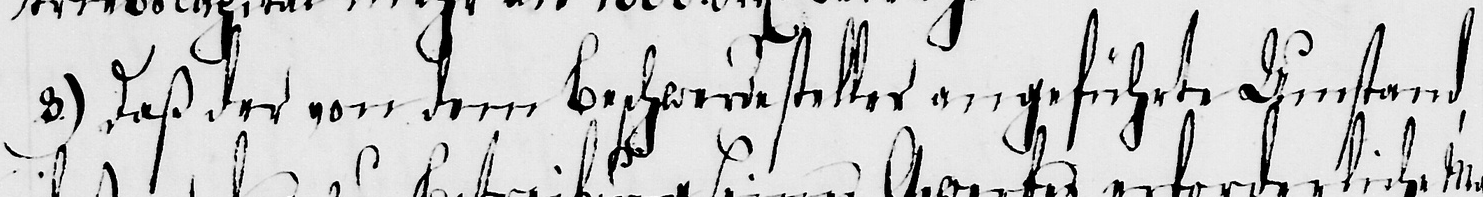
3.) Daß der von dem Beschwerdesteller angeführte Umstand,
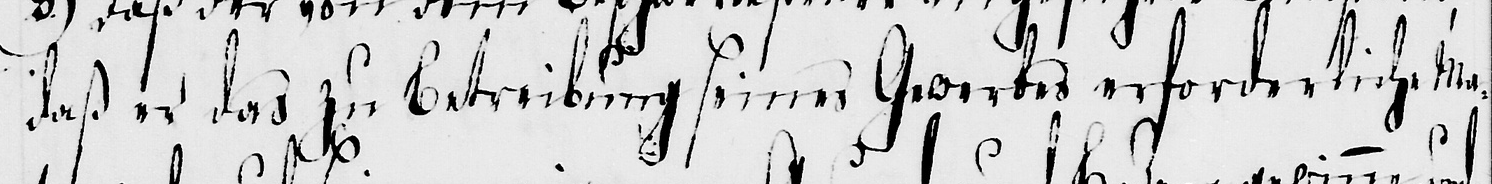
daß er das zu Betreibung seines Gewerbes erforderliche Ma¬
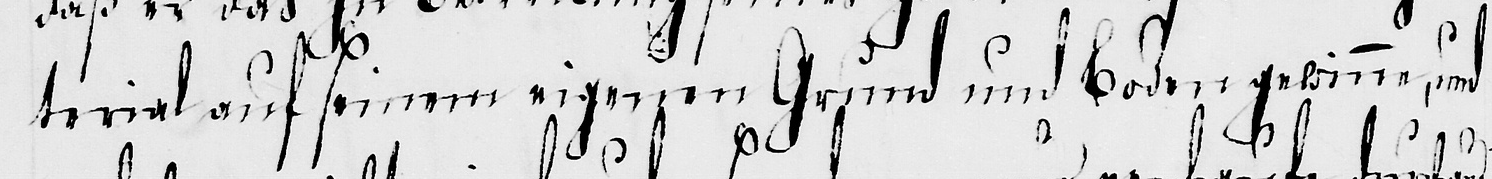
terial auf seinem eigenen Grund und Boden gewinne, und
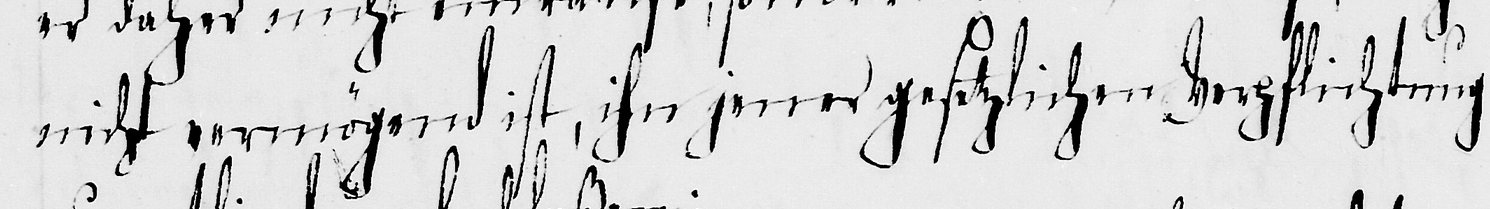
nicht vermögend ist, ihn jener gesetzlichen Verpflichtung
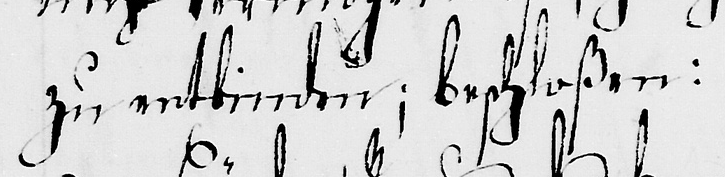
zu entbinden; beschloßen:
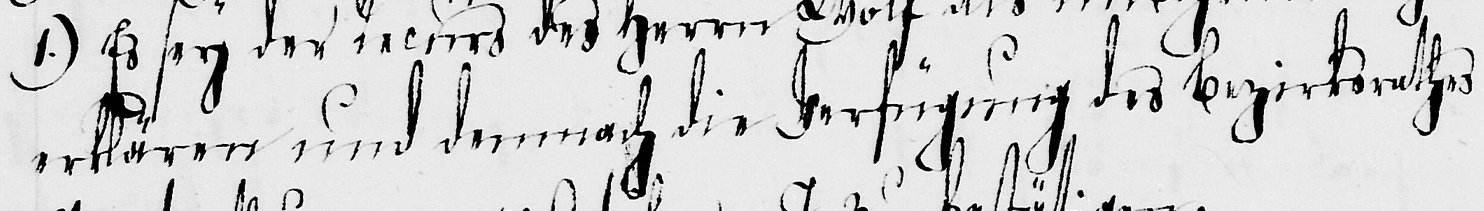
erklären und demnach die Verfügung des Bezirksrathes
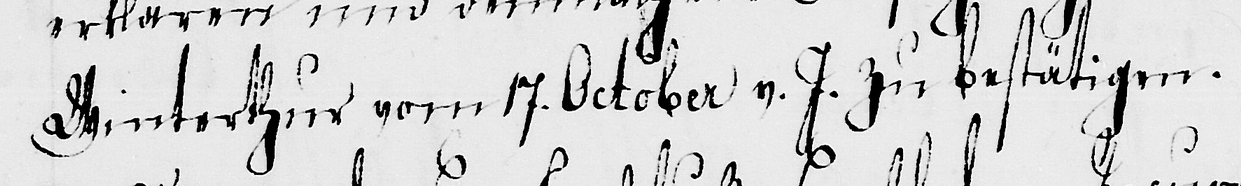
Winterthur vom 17. October v. J. zu bestätigen.
